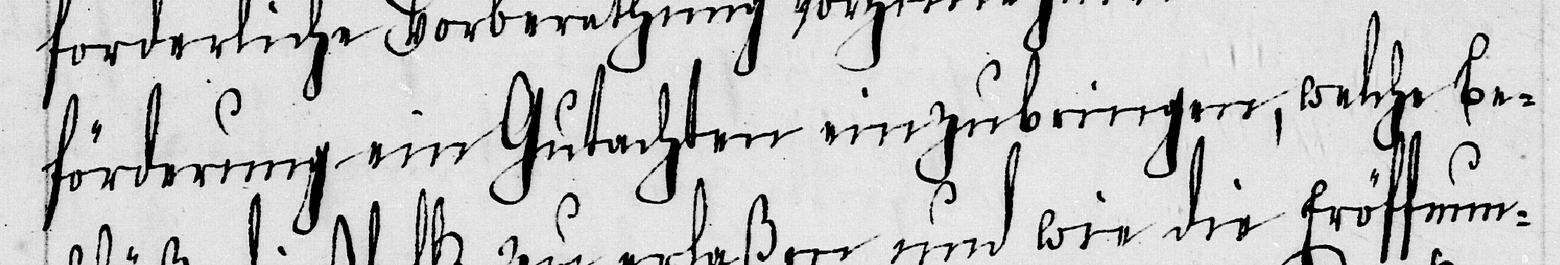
förderung ein Gutachten einzubringen, welche Be¬
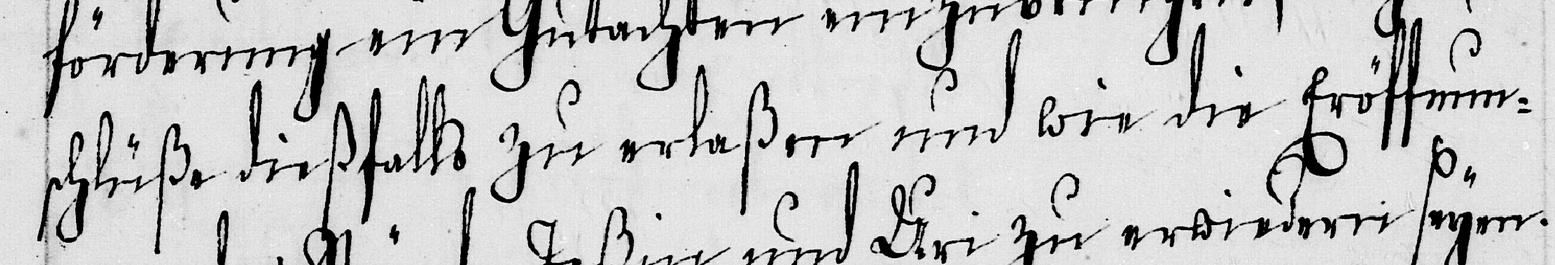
schlüße dießfalls zu erlaßen und wie die Eröffnun¬
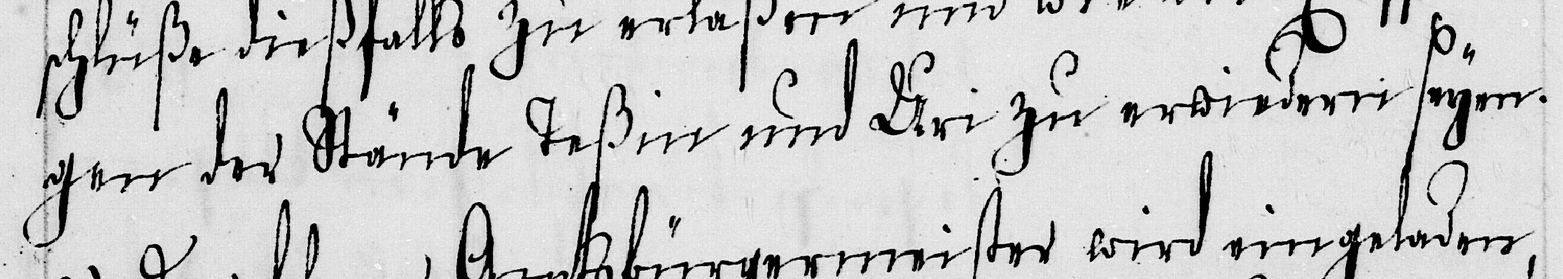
gen der Stände Teßin und Uri zu erwiedern seyen.
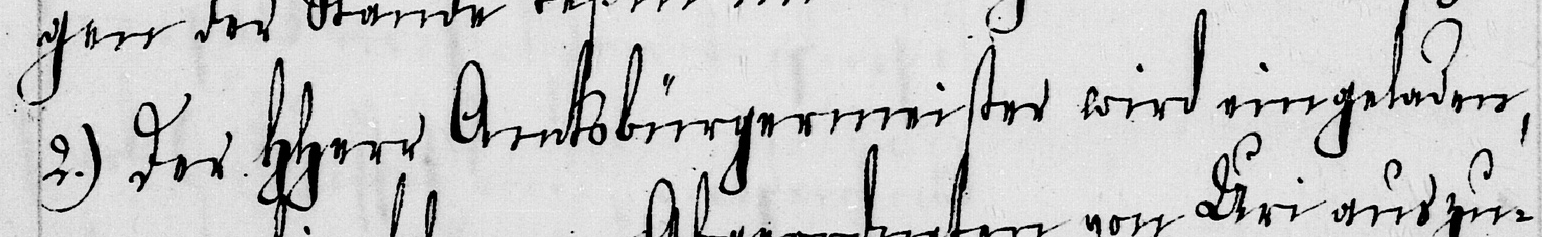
2.) Der HHerr Amtsbürgermeister wird eingeladen,
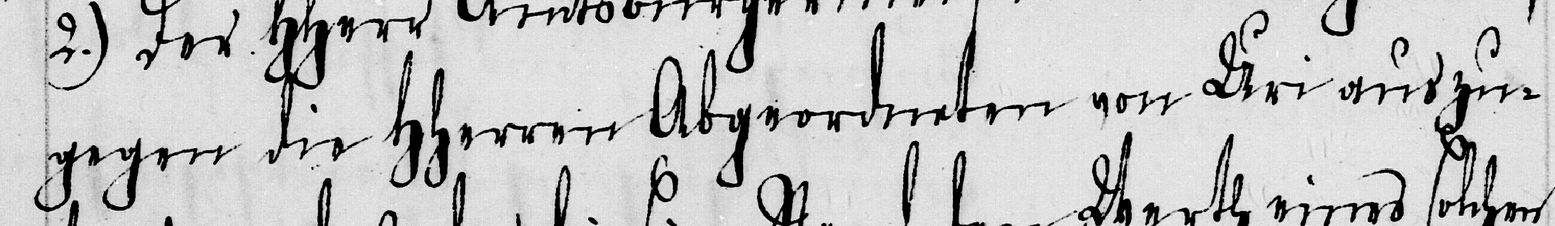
gegen die HHerrn Abgeordneten von Uri auszu¬
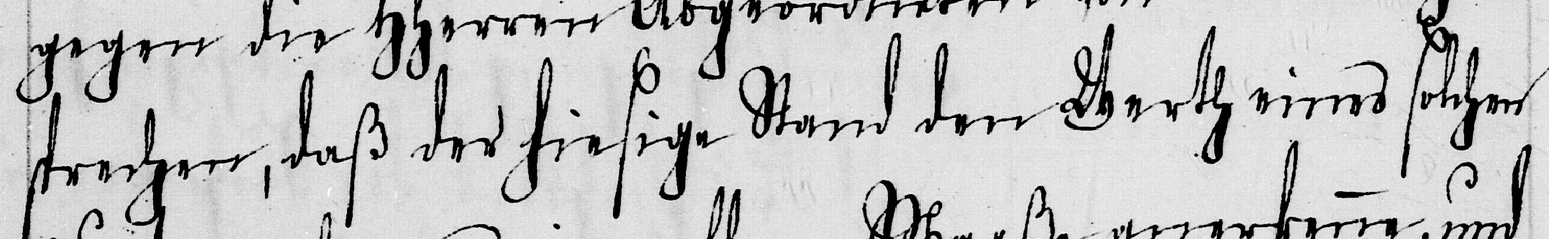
sprechen, daß der hiesige Stand den Werth eines solchen
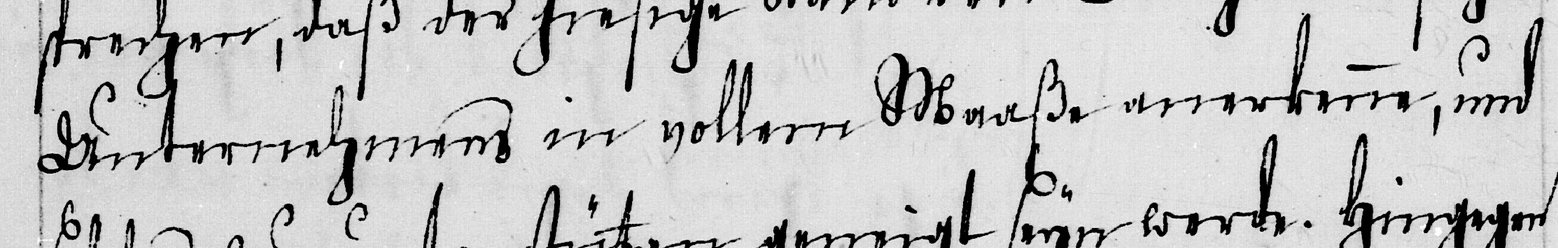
Unternehmens in vollem Maaße anerkenne, und
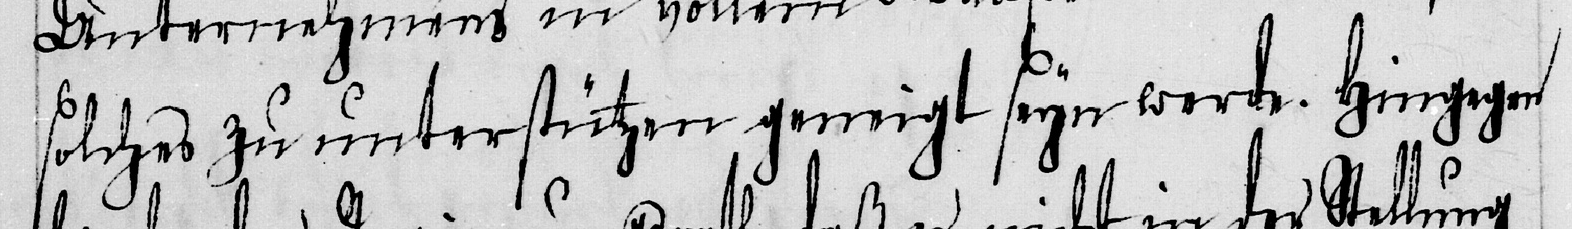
solches zu unterstützen geneigt seyn werde. Hingegen
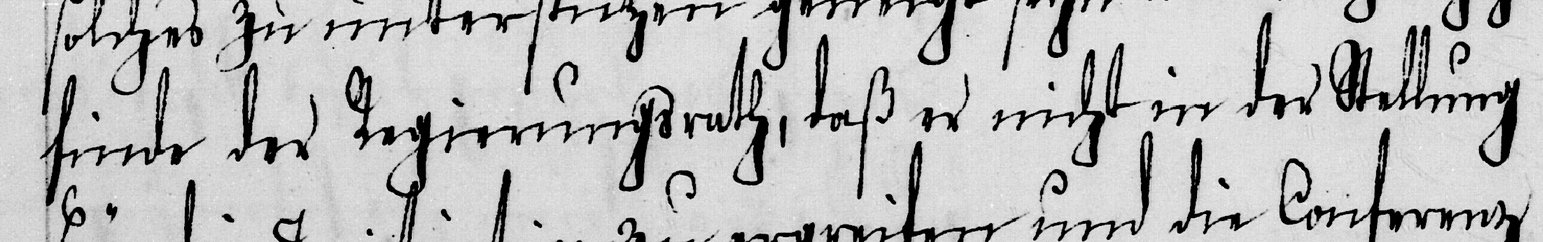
finde der Regierungsrath, daß er nicht in der Stellung
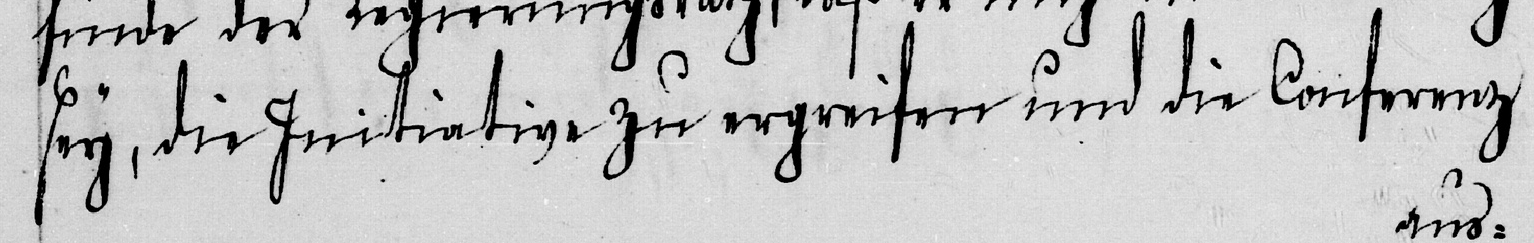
sey, die Initiative zu ergreifen und die Conferenz
